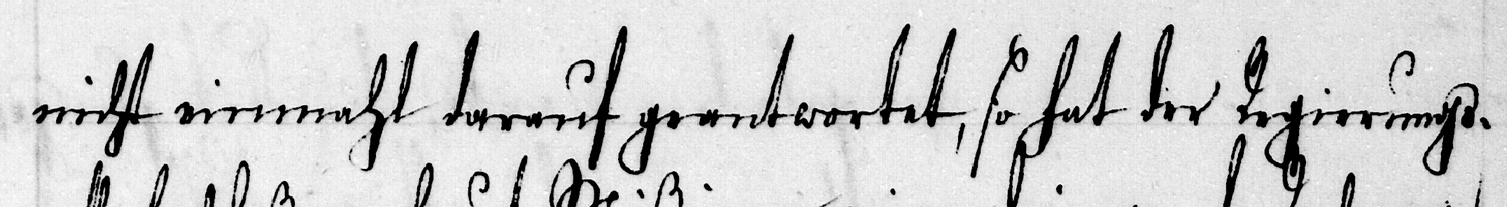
nicht einmahl darauf geantwortet, so hat der Regierungs¬
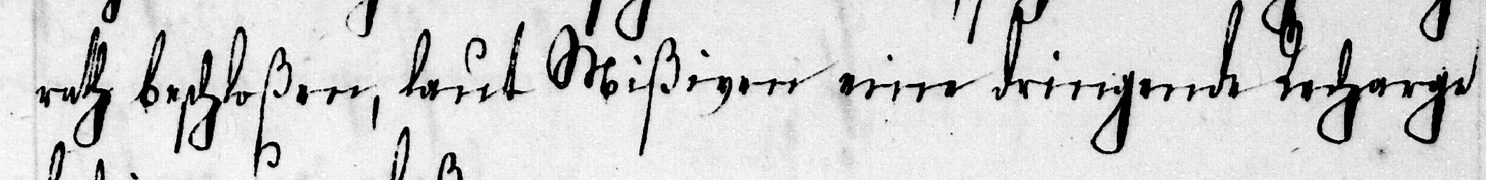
rath beschloßen, laut Mißiven eine dringende Recharge
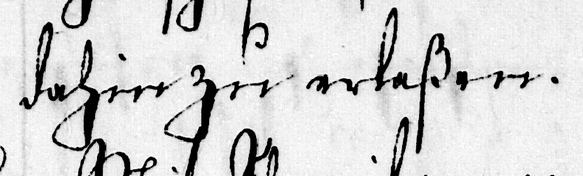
dahin zu erlaßen.
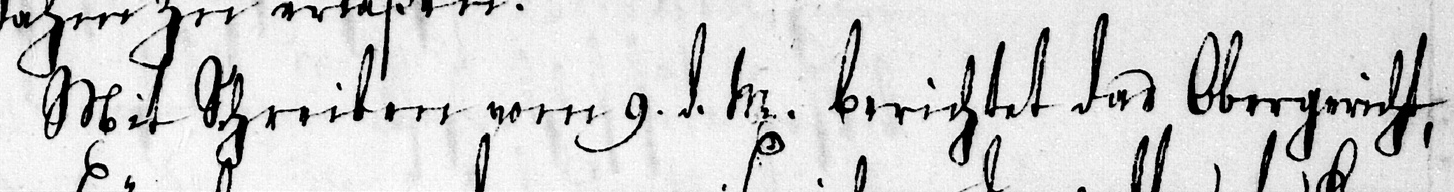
Mit Schreiben vom 9. d. M. berichtet das Obergericht,
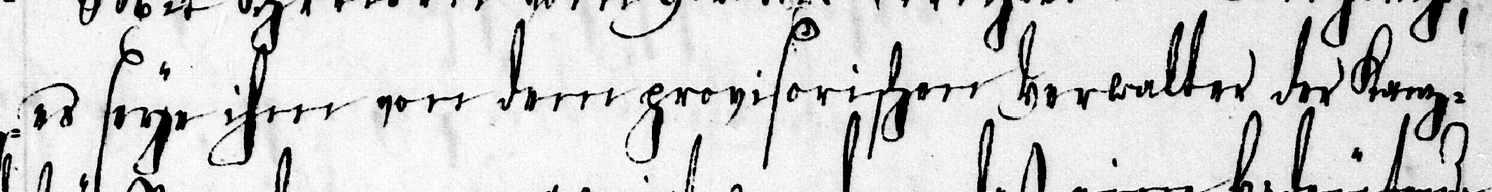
es seye ihm von dem provisorischen Verwalter der Kanz¬
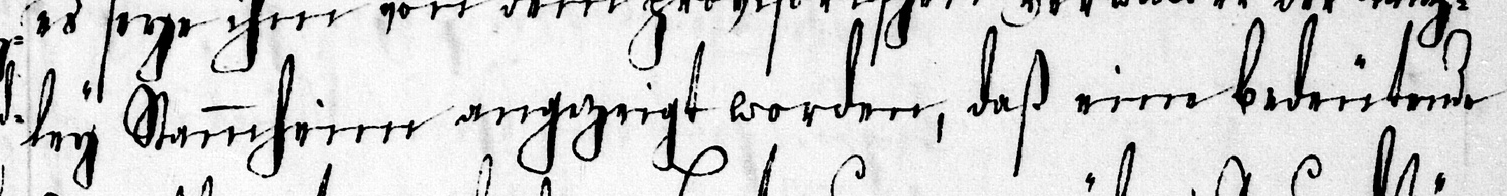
ley Stammheim angezeigt worden, daß eine bedeutende
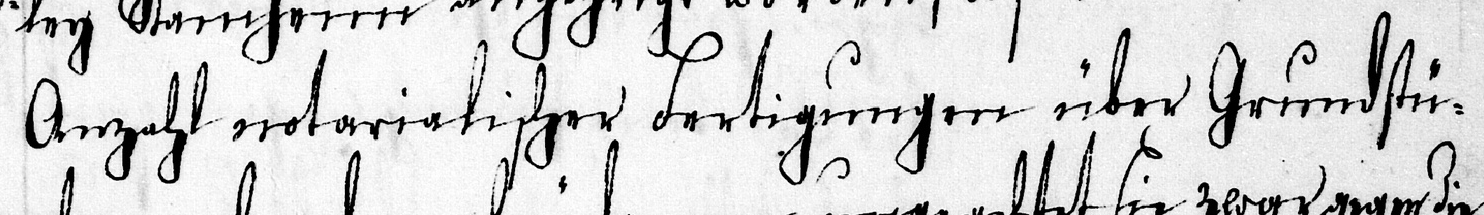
Anzahl notarialischer Fertigungen über Grundstü¬
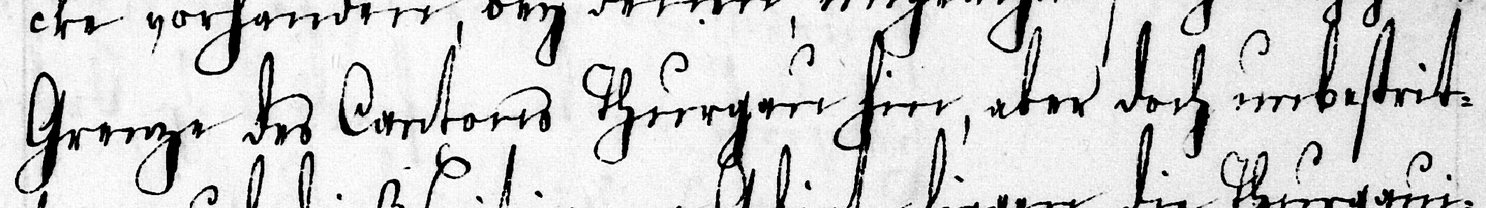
Grenze des Cantons Thurgau hin, aber doch unbestrit¬
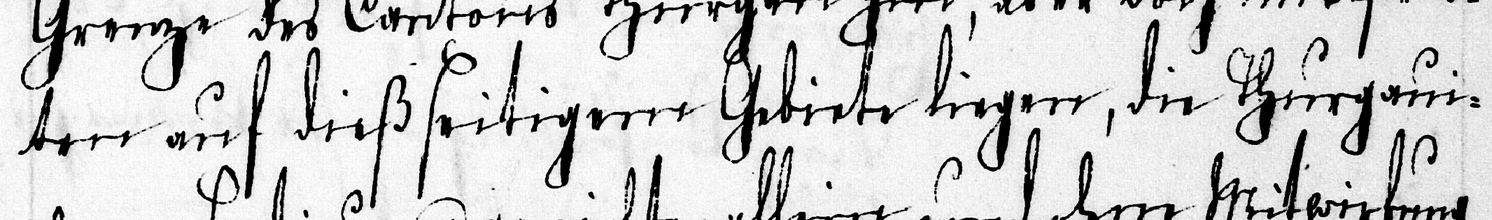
ten auf dießseitigem Gebiete liegen, die Thurgaui¬
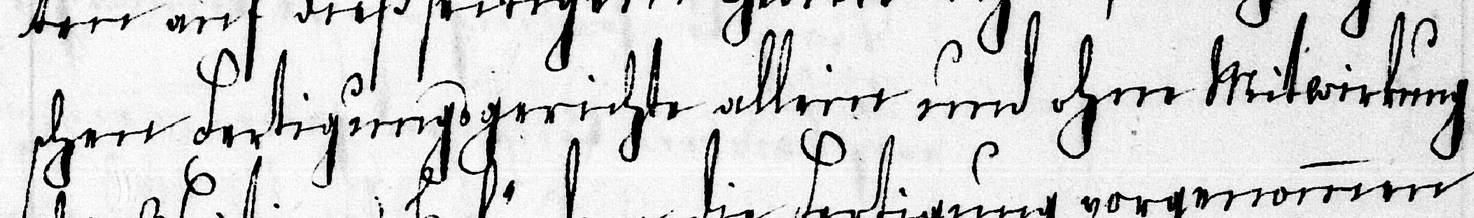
schen Fertigungsgerichte allein und ohne Mitwirkung
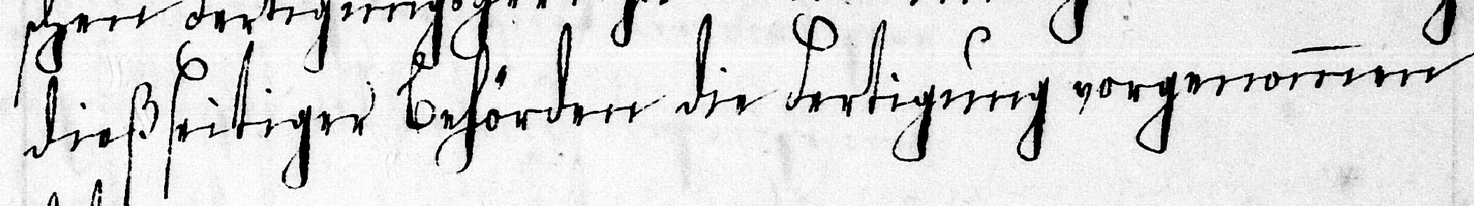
dießseitiger Behörden die Fertigung vorgenommen
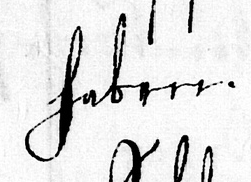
haben.
